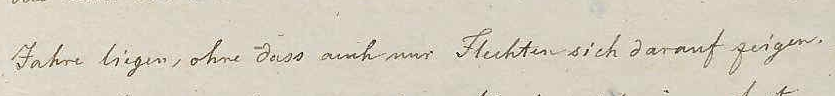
Jahre liegen, ohne dass auch nur Flechten sich darauf zeigen.
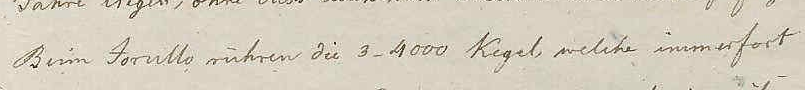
Beim Jorullo rühren die 3–4000 Kegel welche immerfort
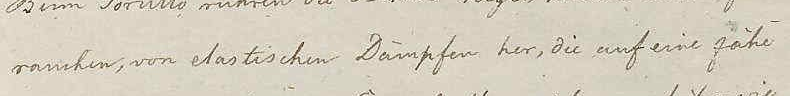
rauchen, von elastischen Dämpfen her, die auf eine zähe
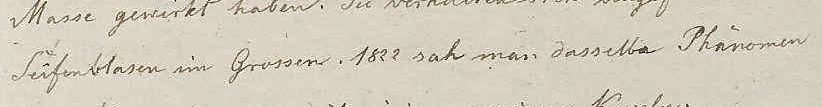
Seifenblasen im Grossen. 1822 sah man dasselbe Phänomen
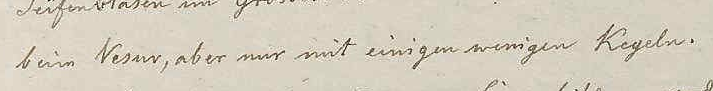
beim Vesuv, aber nur mit einigen wenigen Kegeln.
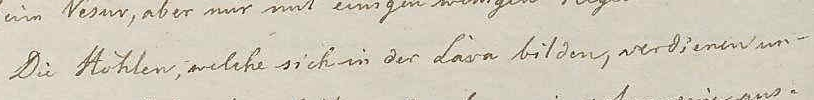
Die Höhlen, welche sich in der Lava bilden, verdienen un-
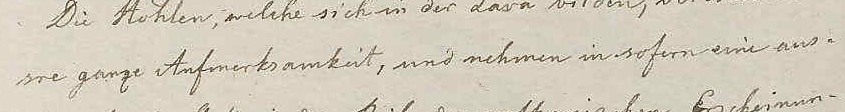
sre ganze Aufmerksamkeit, und nehmen insofern eine aus-
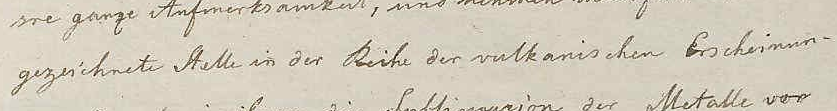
gezeichnete Stelle in der Reihe der vulkanischen Erscheinun-
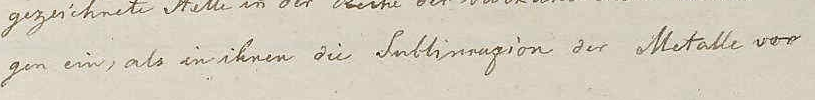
gen ein, als in ihnen die Sublimazion der Metalle vor
